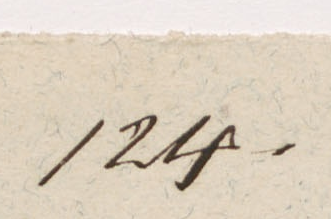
124.
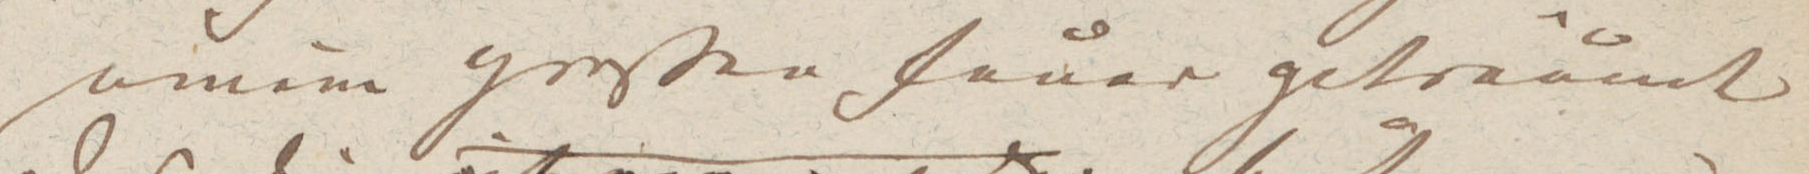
einem grossen Feuer geträumt
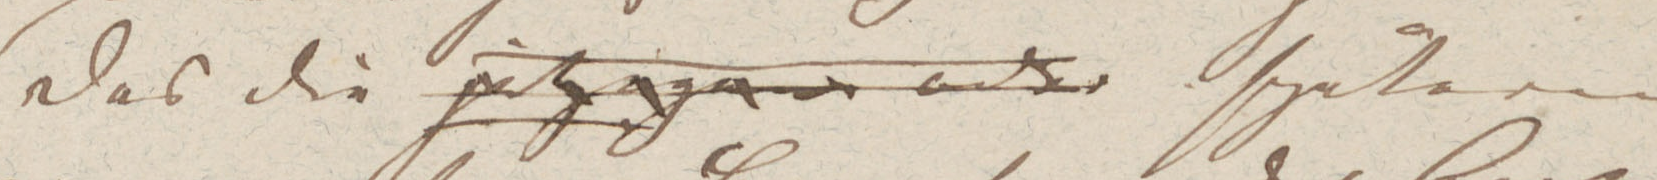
das die jetzigen späteren
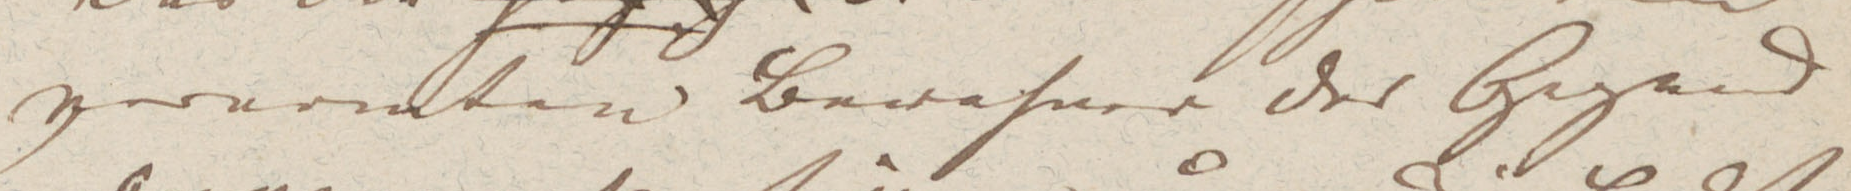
verarmten Bewohner der Gegend
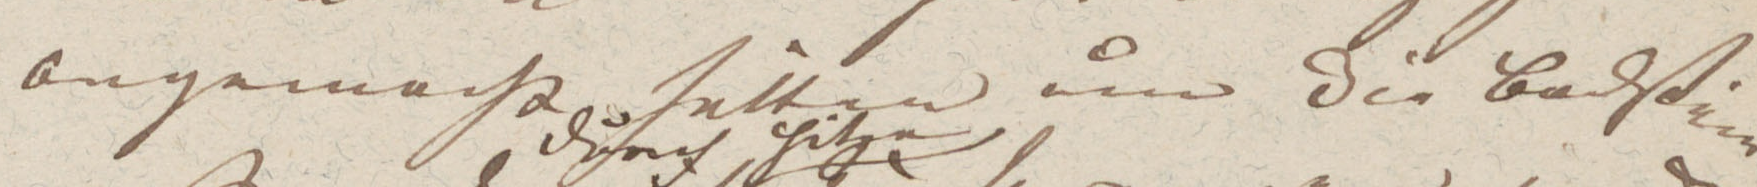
angemacht hätten um die Backstein
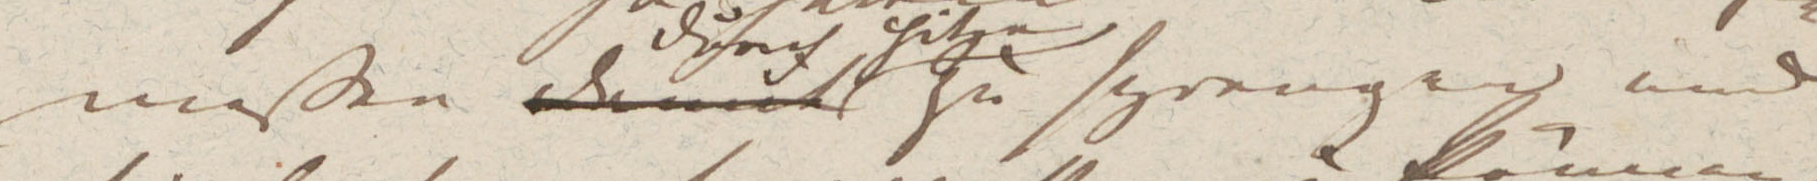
massen damit durch Hitze zu sprengen und
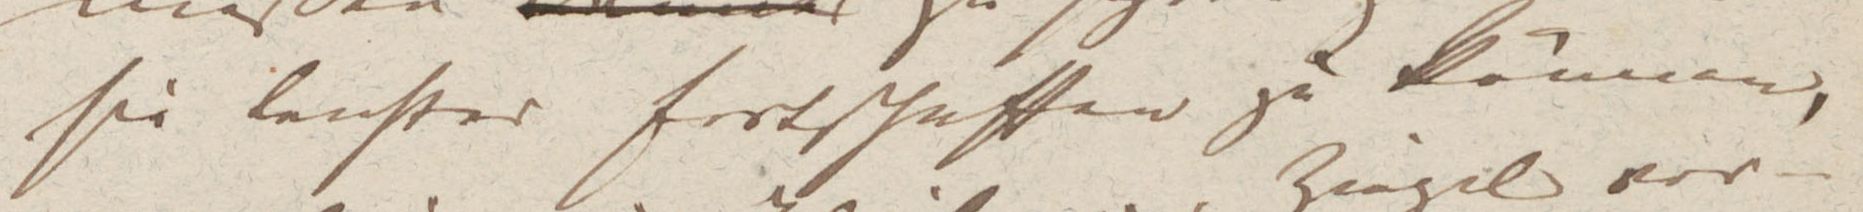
sie leichter fortschaffen zu können,
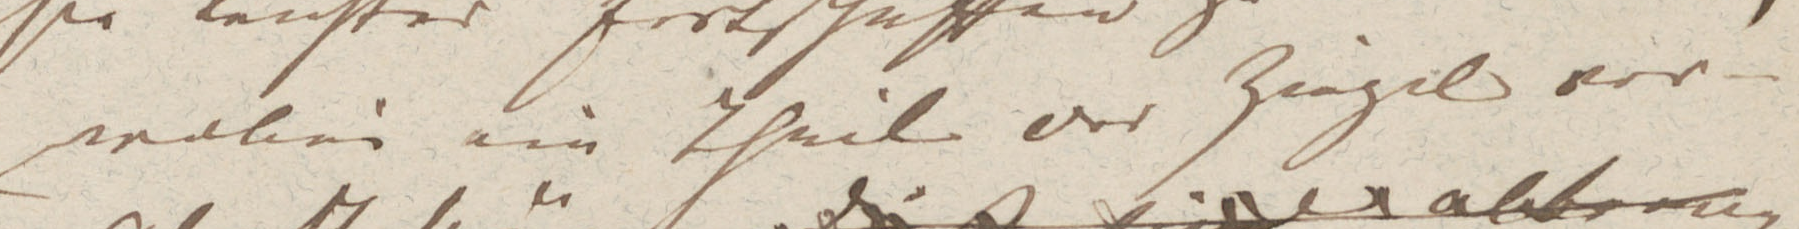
wobei ein Theil der Ziegel ver-
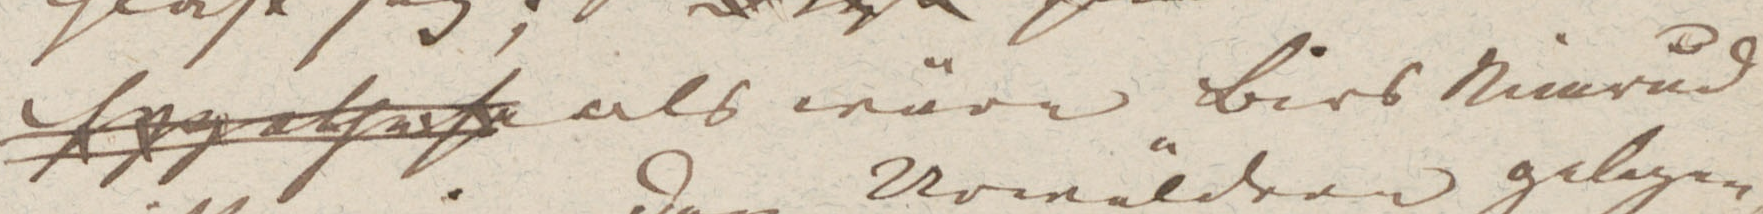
hypothese als wäre Birs Nimrud
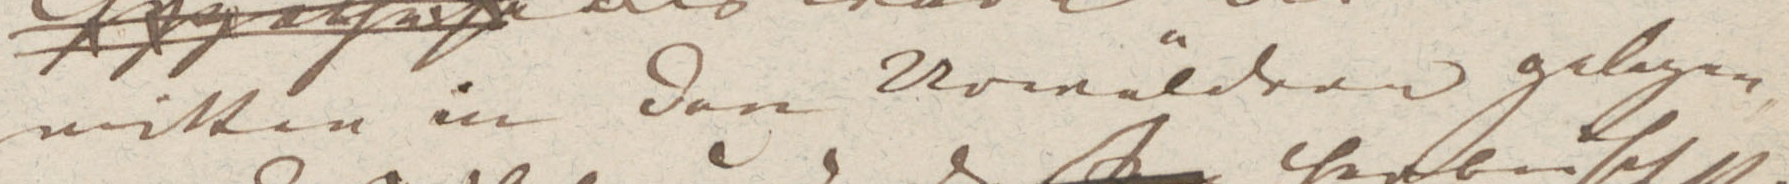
mitten in den Urwäldern gelegen
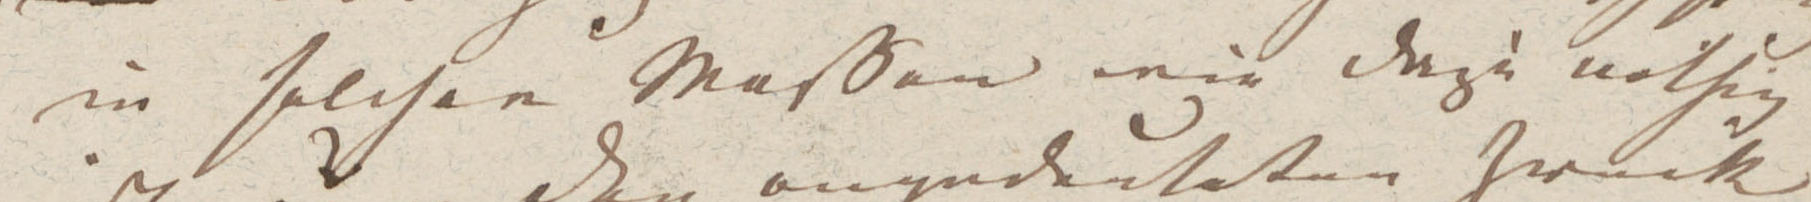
in solchen Massen wie dazu nöthig
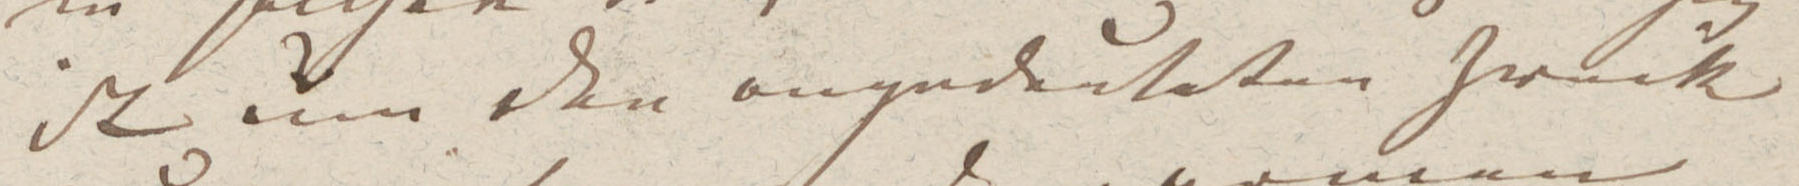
ist um den angedeuteten Zweck
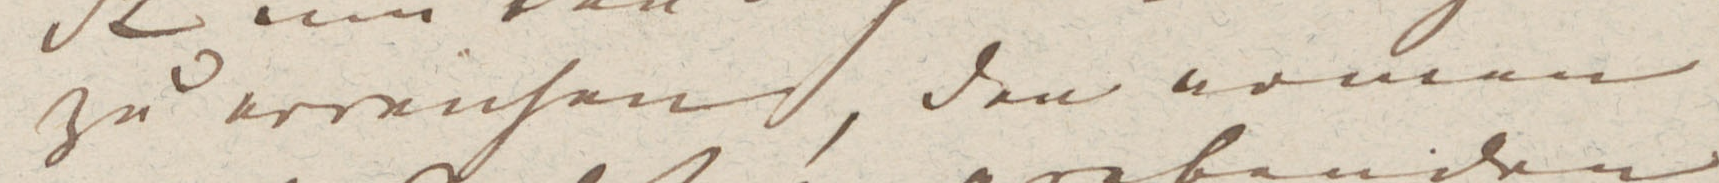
zu erreichen, den armen
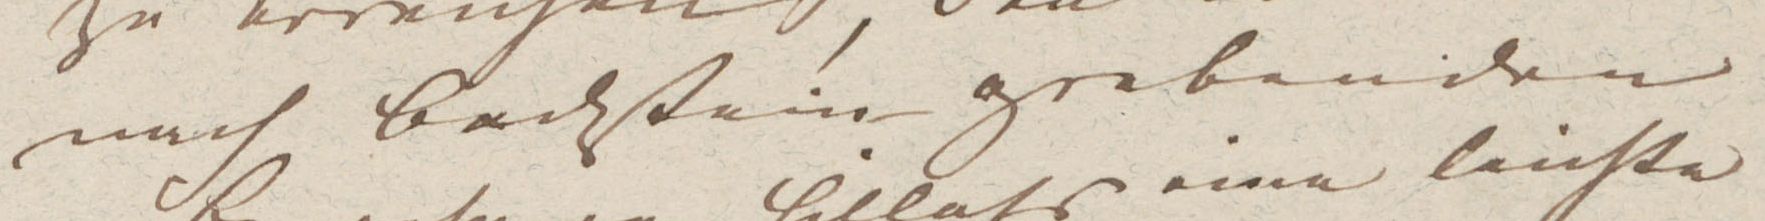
nach Backstein grabenden
